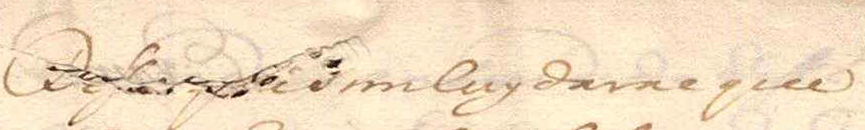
Disse q_e sim Cuydara e que
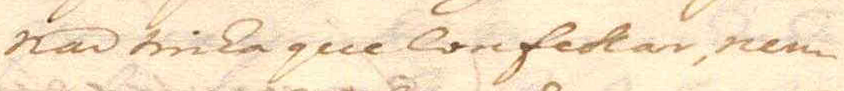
naõ tinha que confessar, nem
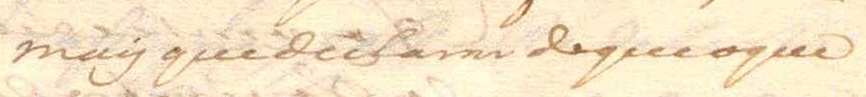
mais que declarar do que o que
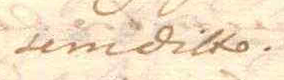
tem ditto.
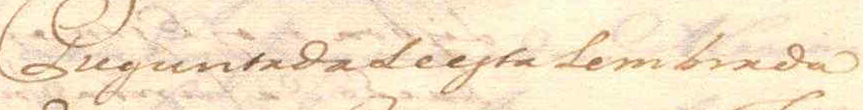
Preguntada se esta lembrada
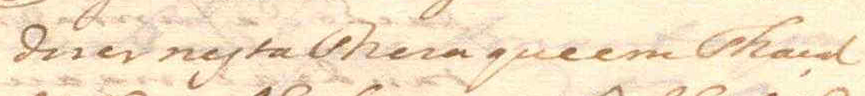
dizer nesta Meza que em Maçal
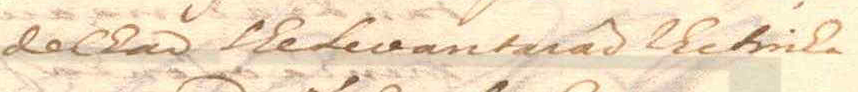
de chaõ lhe Levantaraõ lhe tinha
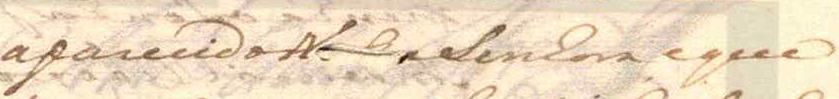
aparecida N__a Senhora, e que
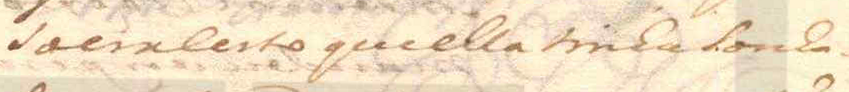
so era certo que ella tinha sonha
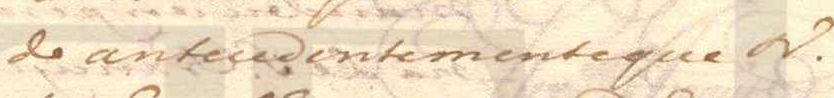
do antecedentemente que N.
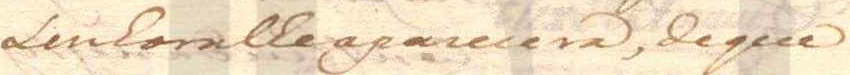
senhora lhe aparecera, de que
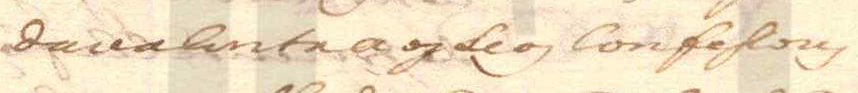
dava conta aos seos confessores
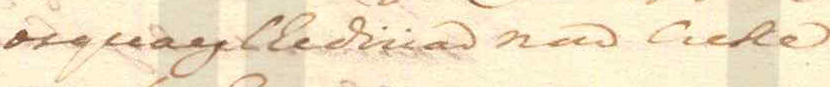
os quaes lhe diziaõ naõ Cresce
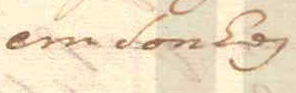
em sonhos
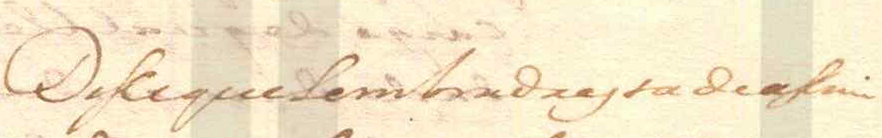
Disse que lembrada esta de assim
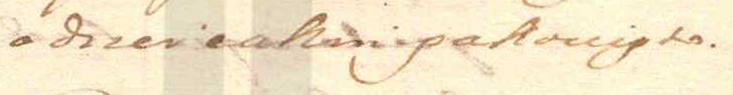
o dizer e assim passou isto.
